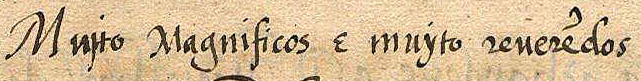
Mujto Magnificos E muyto reuere̅dos
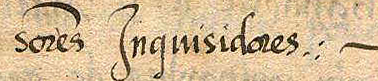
s̅ores Jnquisidores.:
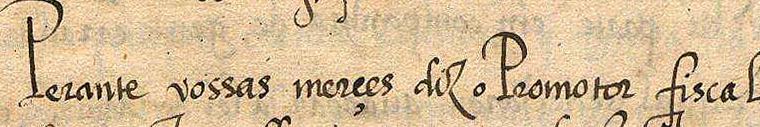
Perante vossas merçes diZ o Promotor fiscaL
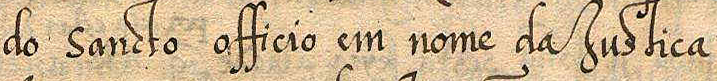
do Sancto officio em nome da Justica
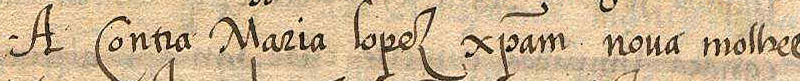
A Contra Maria lopeZ xp̅am noua molher
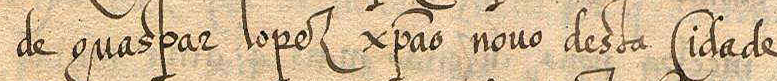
de guaspar lopeZ xpão nouo desta Cidade
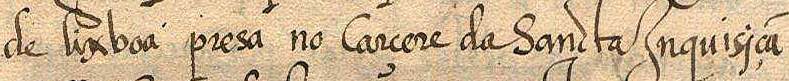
de lixboa presa no Carçere da Sancta Jnquisjça̅
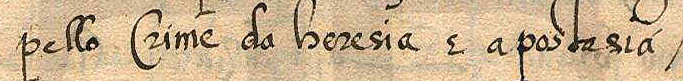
pello Crime da heresia E apostasia /
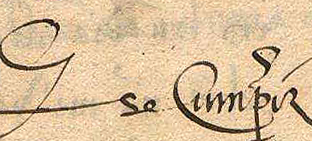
E se Cump̅ir
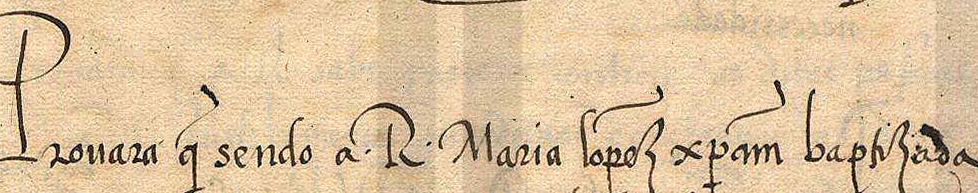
Prouara q̅ sendo a .R. Maria lop̅eZ xp̅am baptiZada
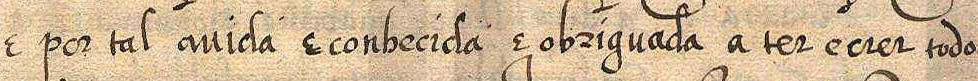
E por tal auida E conhecida E obriguada a ter e crer todo
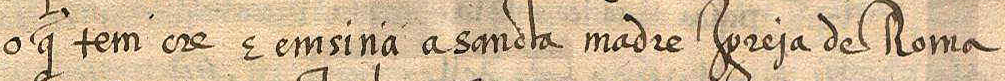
o q̅ tem cre E emsina a sancta madre Jgreja de Roma
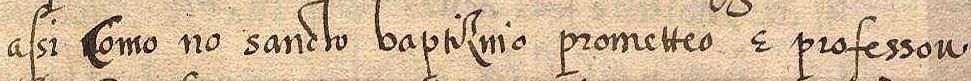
assi Como no sancto baptiZmo prometteo E professou
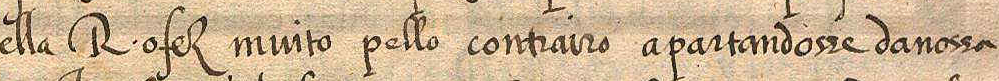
ella R. o feZ muito pello contrairo apartandosse da nossa
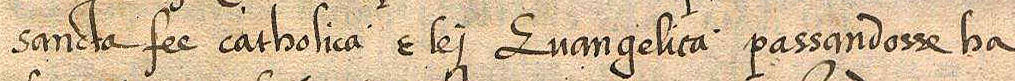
sancta fee catholica E lej Euangelica passandosse ha
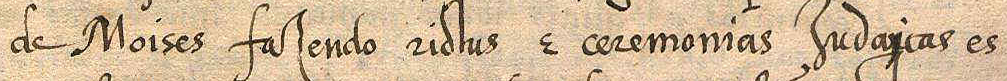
de Moises faZendo rictus E ceremonias Judaycas es
